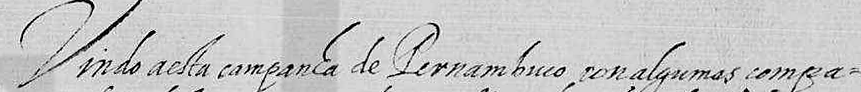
Vindo a esta campanha de Pernambuco con algumas compa
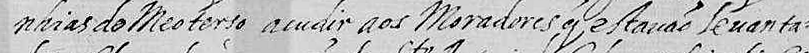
nhias do Meo terso acudir aos Moradores q̄ estauaõ leuanta
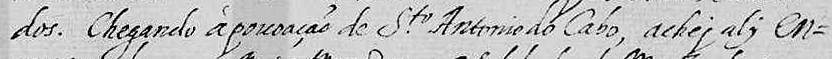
dos. Chegando à pouoaçaõ de S.to Antonio do Cabo, achej aly en
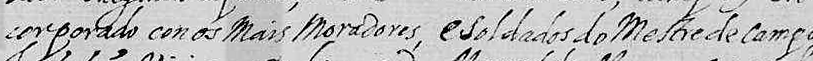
corporado con os mais moradores, e soldados do Mestre de campo
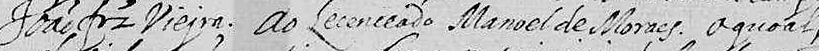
Joaõ frz̄ Viejra. ao Lecenceado Manoel de Moraes. o quoal,
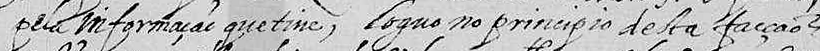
pela informaçaõ que tiue, loguo no principio desta facçaõ
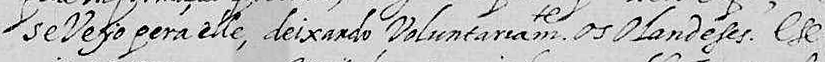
se Veyo pera elle, deixando Voluntariam.te os Olandeses. E se
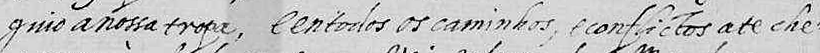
guio a nossa tropa, e en todos os caminhos, e conflictos ate che
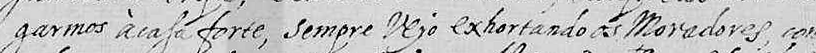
garmos à casa forte, sempre vejo exhortando os moradores con
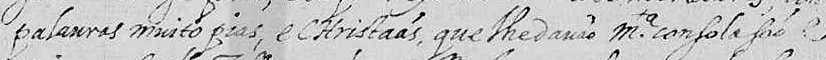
palauras muito pias, e cHristaās, que lhe dauão m.ta consolasaõ E
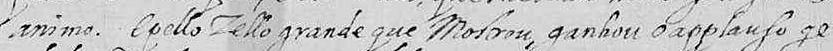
animo. E pello Zello grande que Mostrou, ganhou o applauso ge
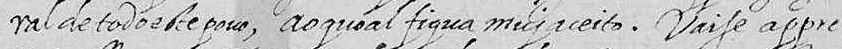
ral de todo este pouo, ao quoal fiqua muj aceito. Vaise appre
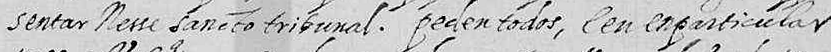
sentar Nesse sancto tribunal. peden todos, E eu en particular
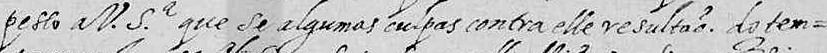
pesso V. S.a que se algumas culpas contra elle resultaõ do tem
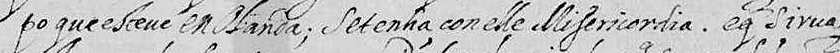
po que esteue en Olanda; se tenha con elle Misericordia. e q̄ sirua
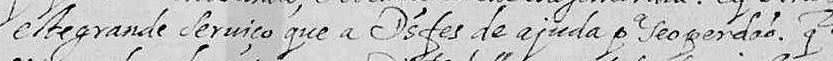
este grande seruiço que a Ds̄ fes de ajuda pa seo perdaõ. q̄
